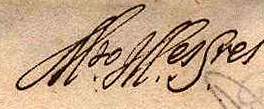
M.to Ill.es S.res
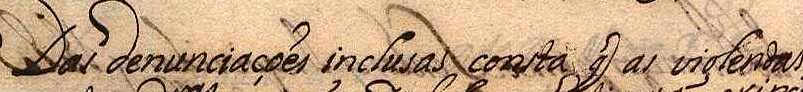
Das denunciaçoẽs inclusas consta q̄ as violentas,
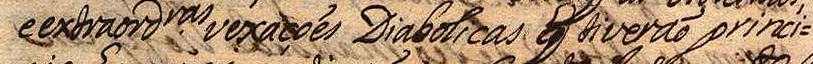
e extraord.ras vexaçoẽs Diabolicas q̄ tiveraõ princi
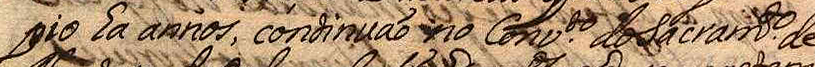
pio ha annos, continuaõ no Conv.to do sacram.to. de
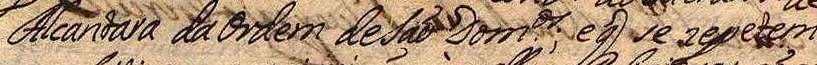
Alcantara da Ordem de Saõ Dom.os; e q̄ se repetem
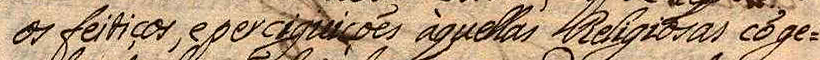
os feitiços, e perciguiçoẽs àquellas Religiosas cō ge
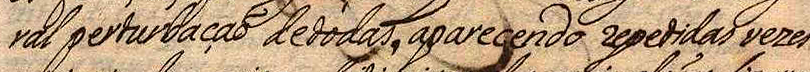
ral perturbaçaõ de todas, aparecendo repetidas vezes
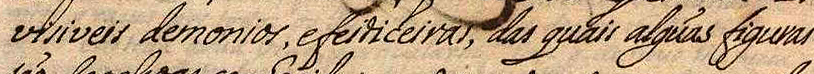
visiveis demonios, e feiticeiras, das quais algūas figuras
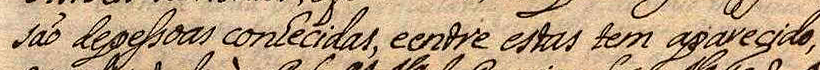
saõ de pessoas conhecidas, e entre estas tem aparecido,
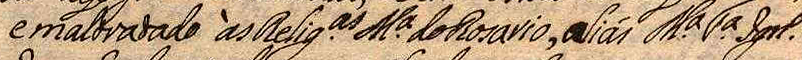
e maltratado às Relig.as M.a do Rosario, aliás M.a T.a Ign.a
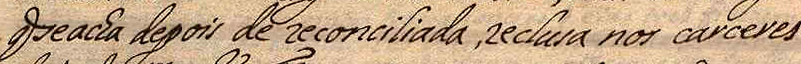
q̄ se acha depois de reconciliada, reclusa nos carceres
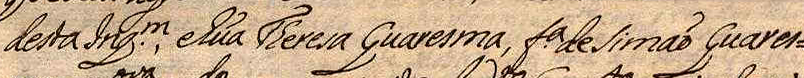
desta Inq.m, e huā Theresa Quaresma, f.a de simaõ Quares
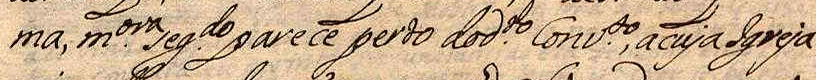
ma, m.ora seg.do parece perto do d.to Conv.to, a cuja Igreja
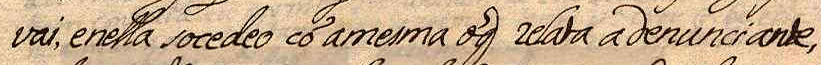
vai, e nella socedeo cō a mesma o q̄ relata a denunciante,
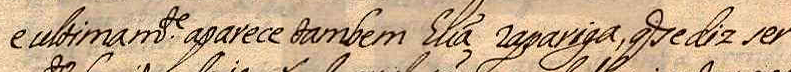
e ultimam.te aparece tambem huā rapariga, q̄ se diz ser
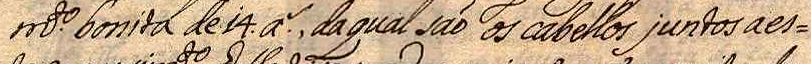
m.to bonita de i4. a.s, da qual saõ os cabellos juntos a es
